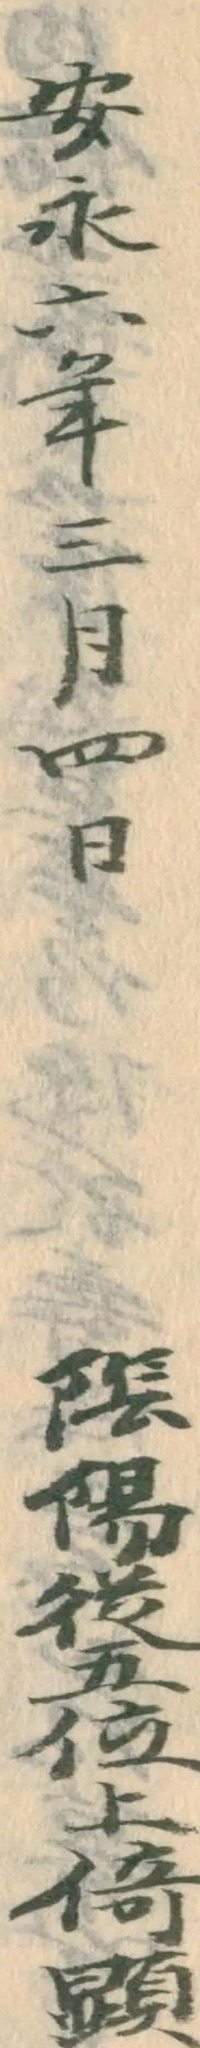安永六年三月四日陰陽従五位上倚顕
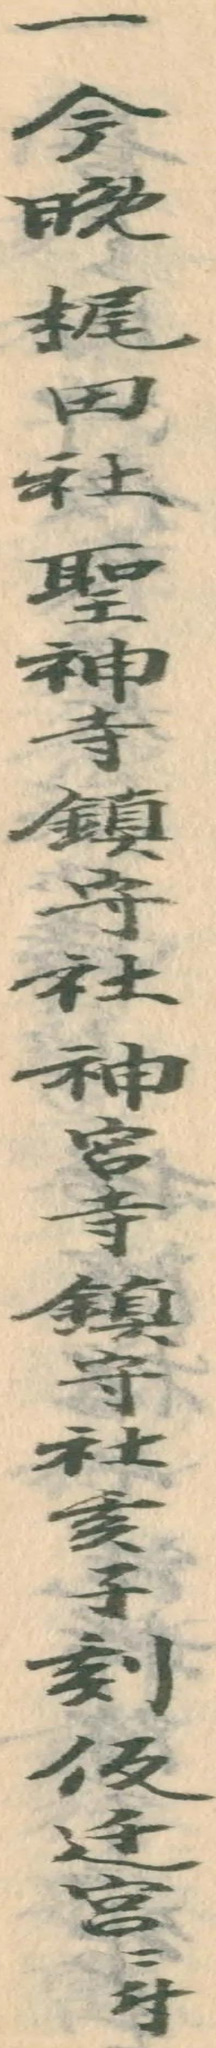一今晩梶田社聖神寺鎮守社神宮寺鎮守社亥子刻仮迁宮ニ付

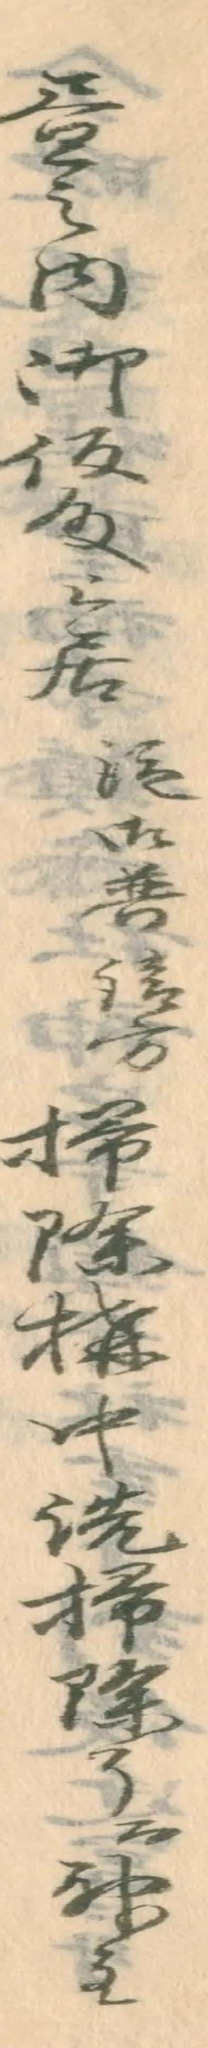昼之内御仮殿被居従御普請方掃除構中洗掃除了而神主
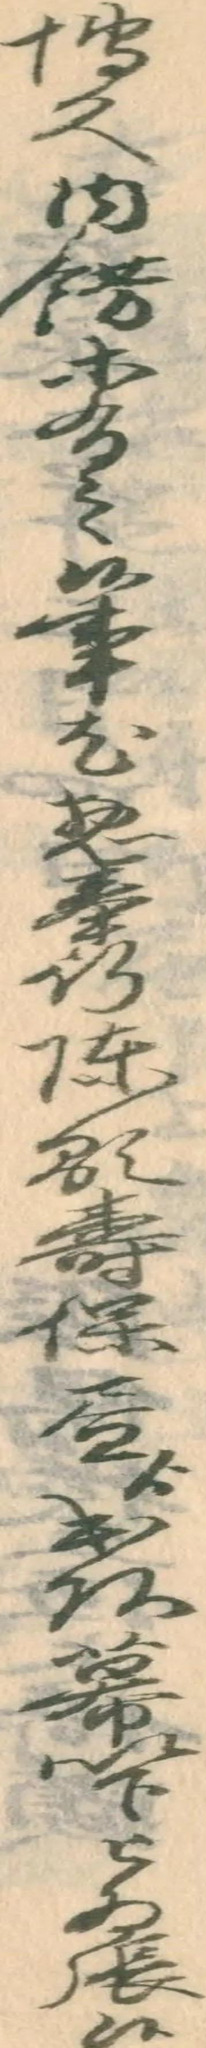博久内飾等有之候事尤惣奉行陳顕寿保昼ゟ出頭幕以下被為張候
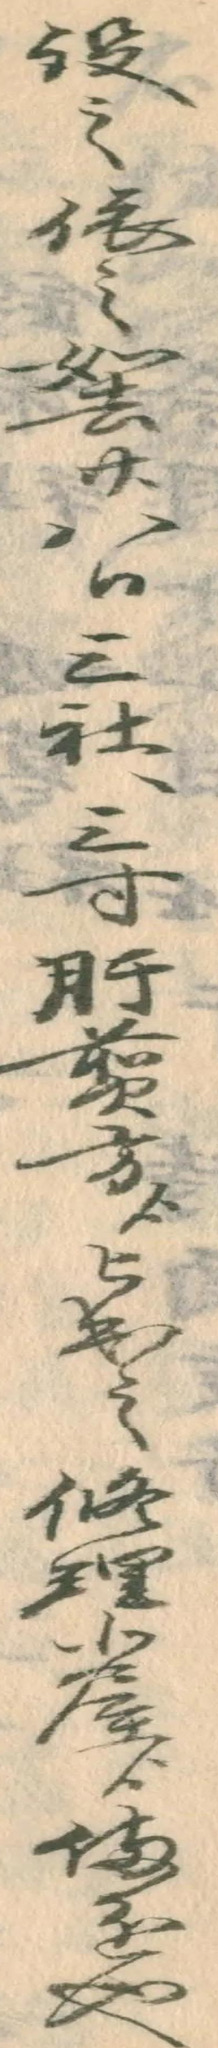設之依之如去廿八日三社へ三寸肝煎方ゟ被遣之修理小屋ゟ備進也
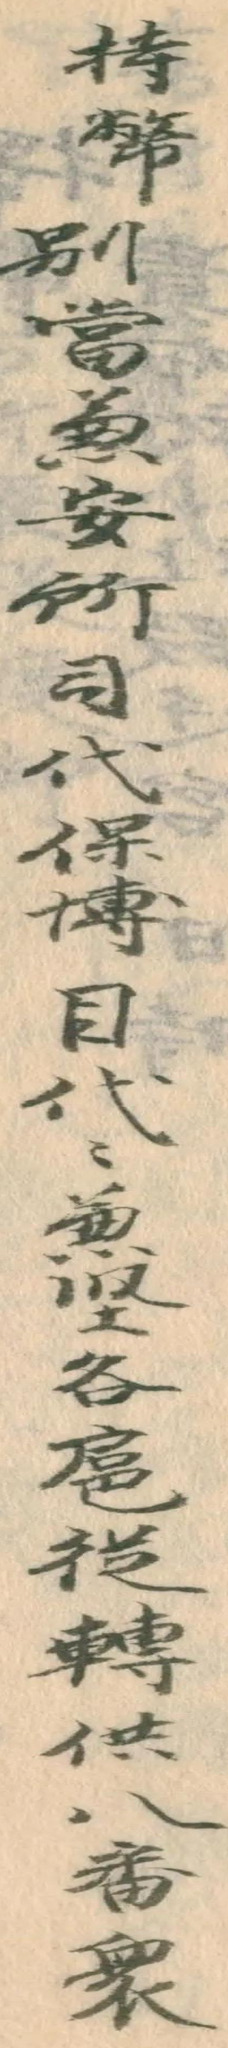持幣別当兼安所司代保博目代々兼堅各扈従転供八番衆
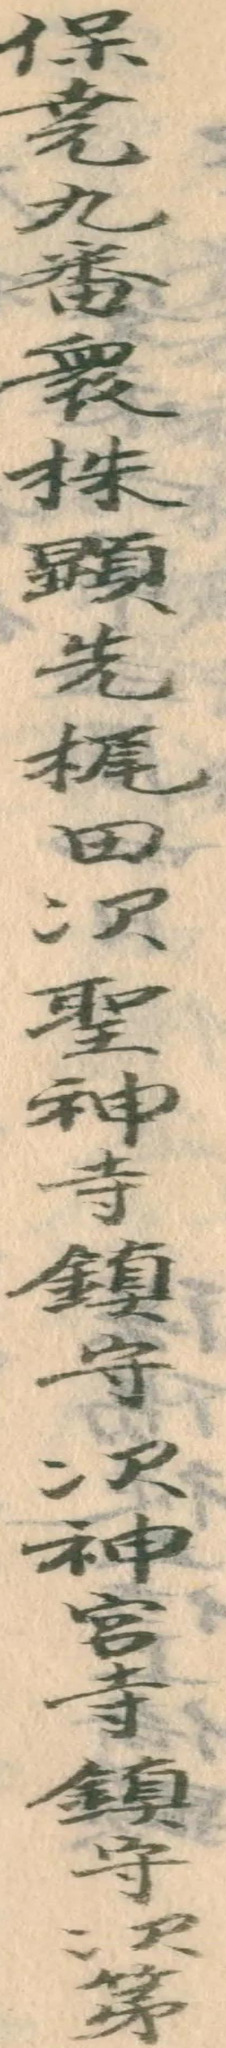保尭九番衆株顕先梶田次聖神寺鎮守次神宮寺鎮守次第
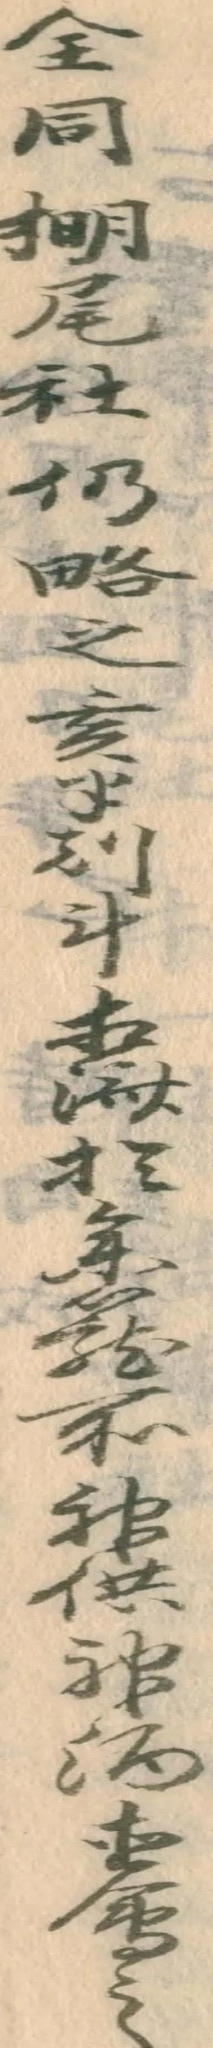全同棚尾社仍略之亥半刻計相済於参籠所神供神酒直会之
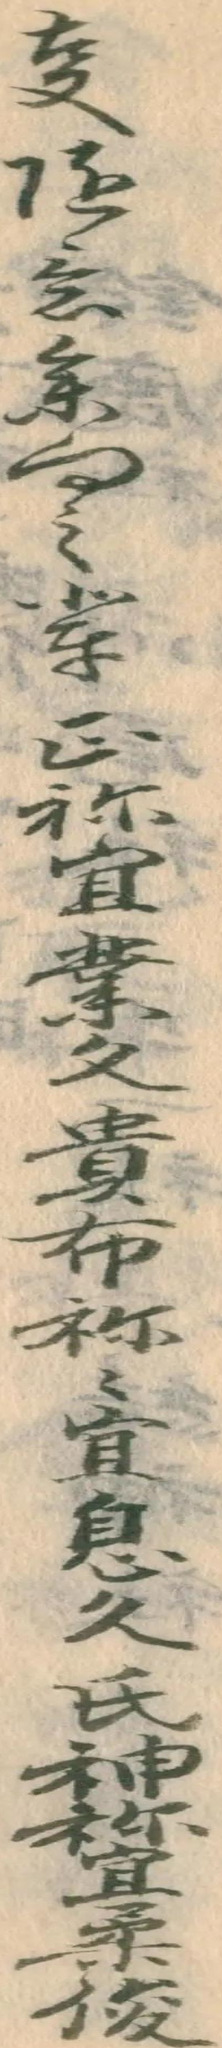事随意参向之輩正祢宜業久貴布祢々宜息久氏神祢宜柔俊
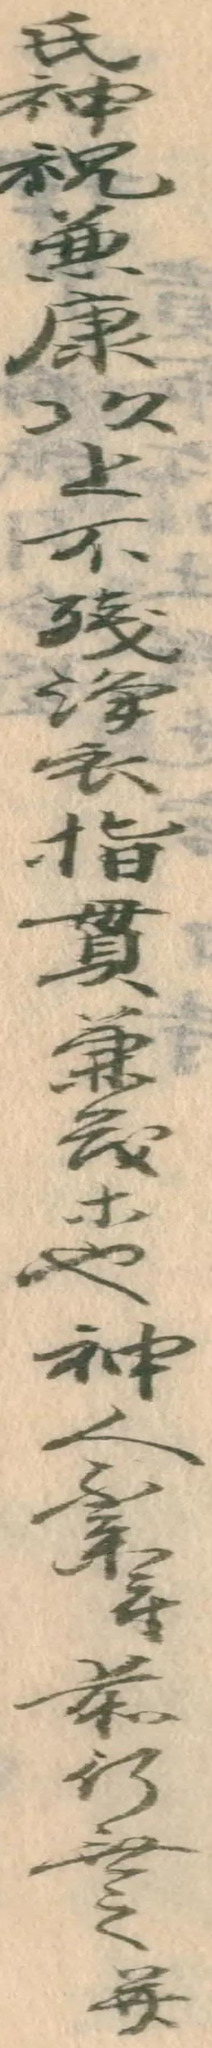氏神祝兼康以上不残浄衣指貫兼茂等也神人不参ニ付前行無之并
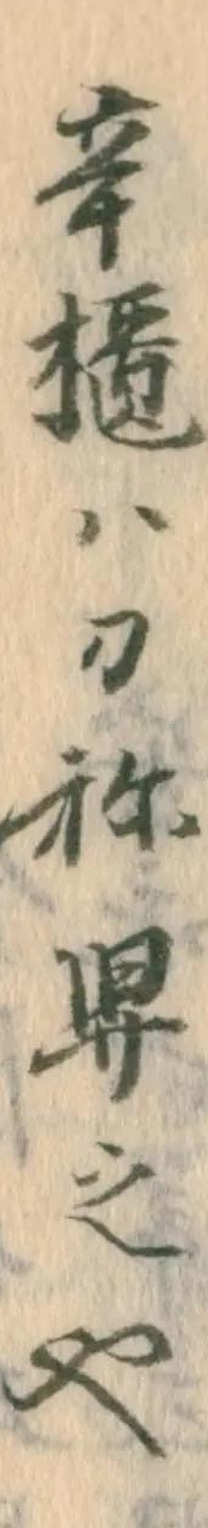辛櫃ハ刀祢舁之也
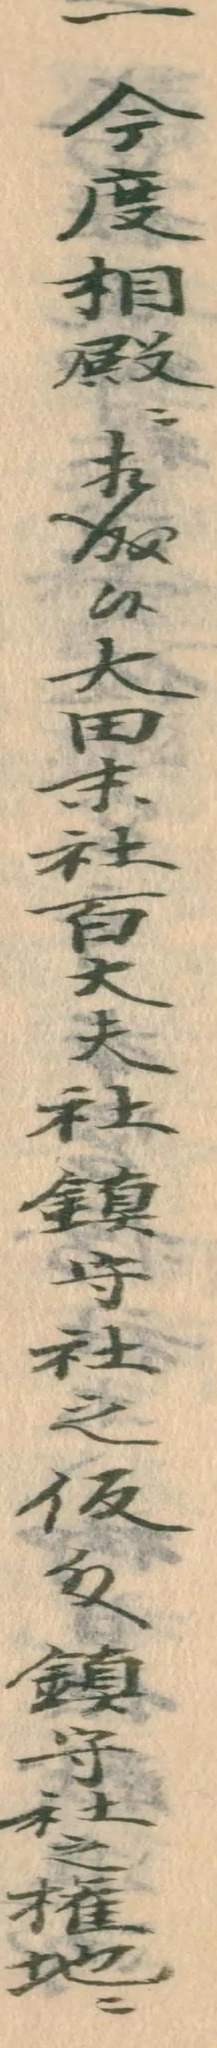一今度相殿ニ相成候大田末社百大夫社鎮守社之仮殿鎮守社之権地ニ
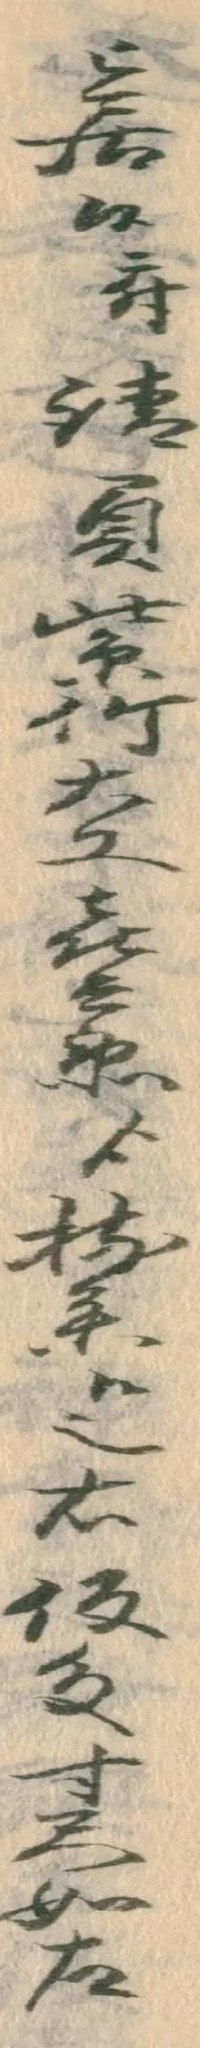被居候ニ付請負紫竹大工喜兵衛ゟ持参候也右仮殿寸尺如左
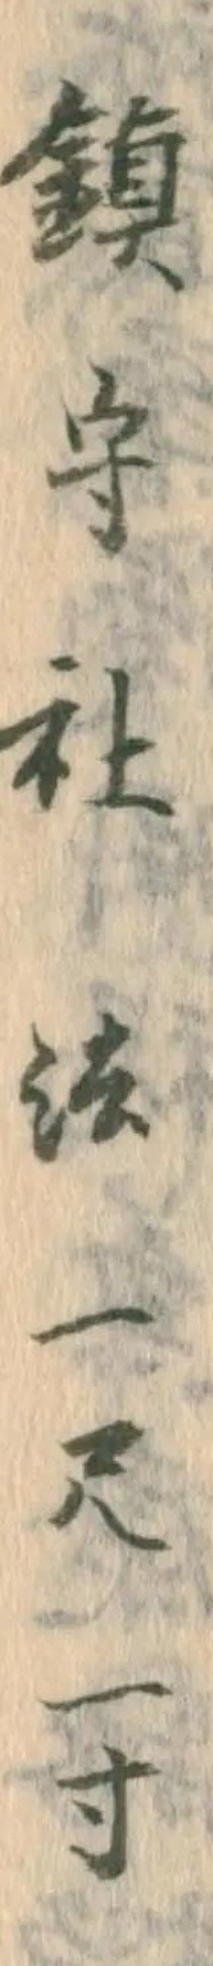鎮守社法一尺一寸
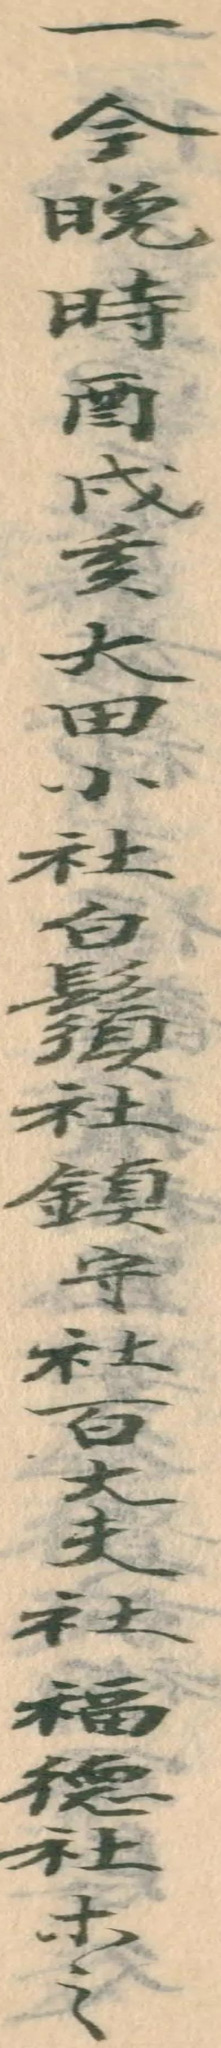一今晩時酉戌亥大田小社白鬚社鎮守社百大夫社福徳社等之
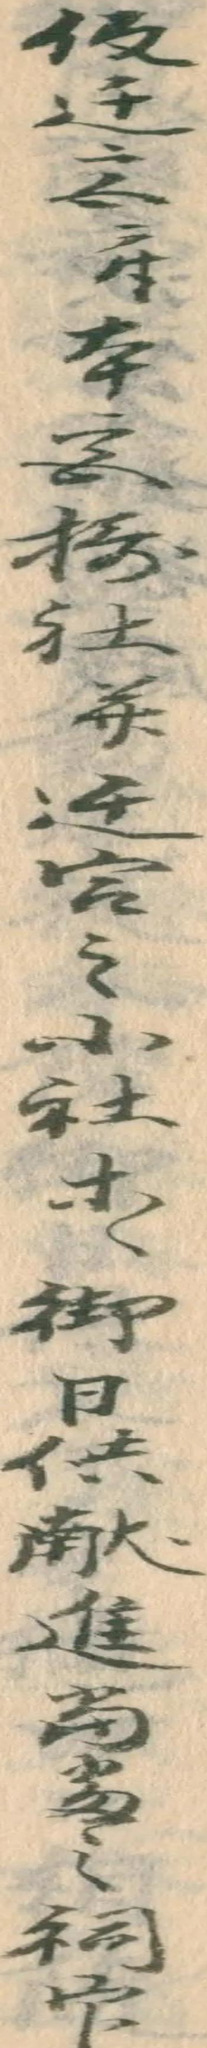仮迁宮ニ付本宮摂社并迁宮之小社等へ御日供献進当番之祠官
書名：賀茂社記録. 第17冊
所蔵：国立国会図書館 National Diet Library, JAPAN
